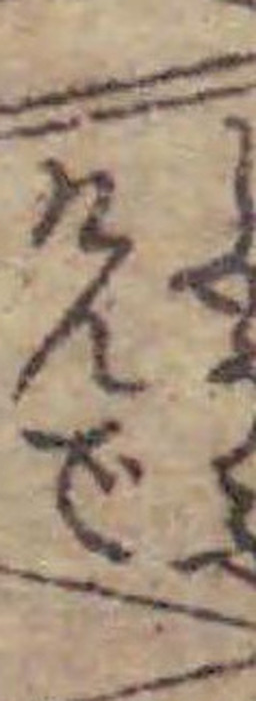けんで
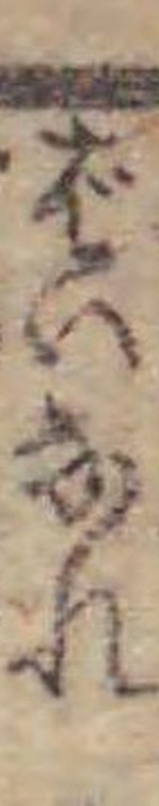ばいなれ
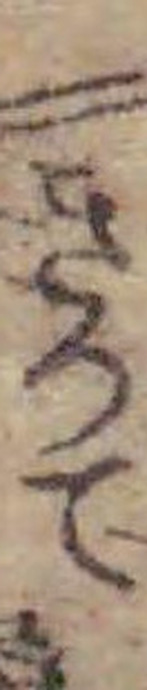きつて
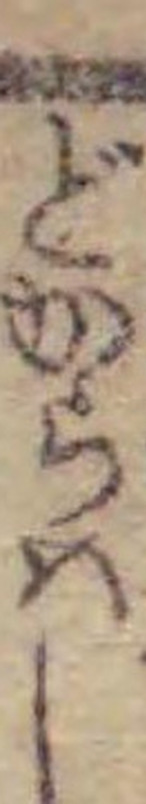どからは
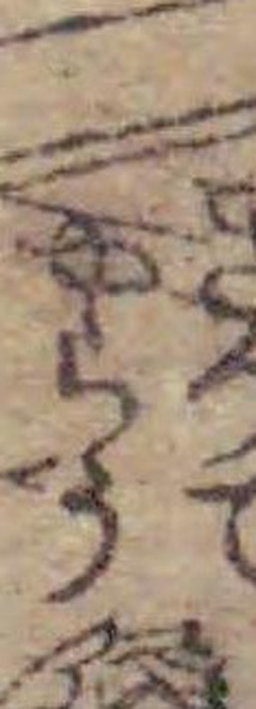やらう
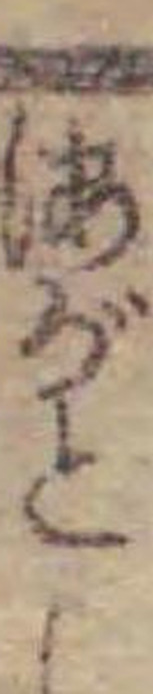海がと
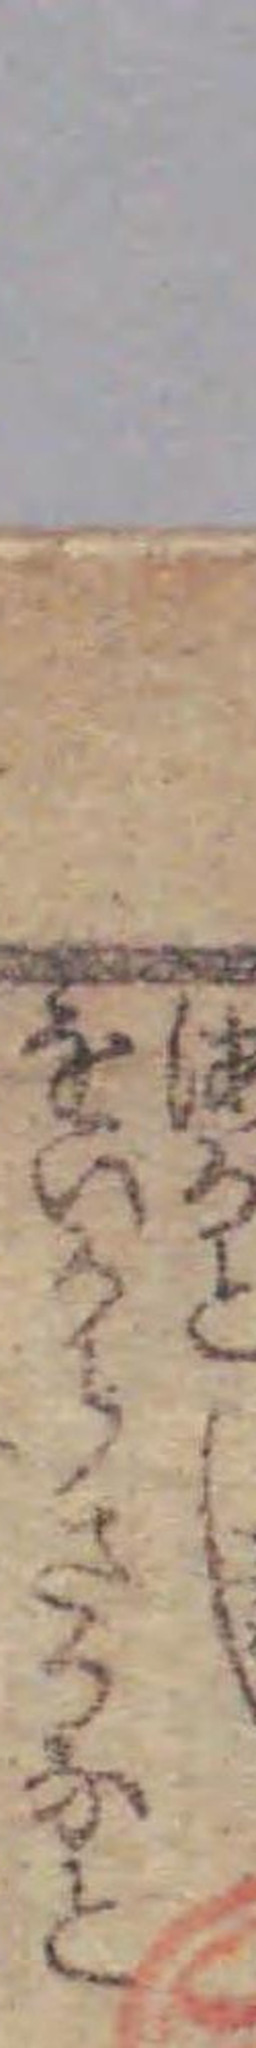をいからさかなと
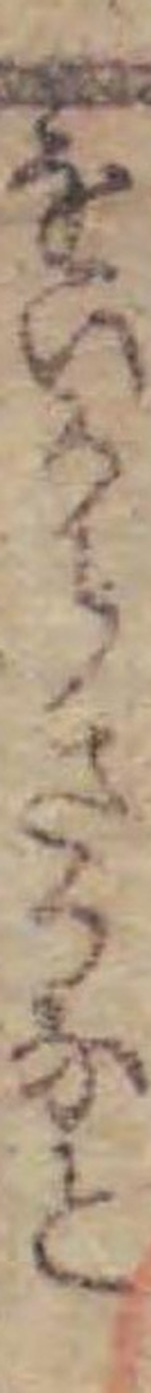をいからさかなと
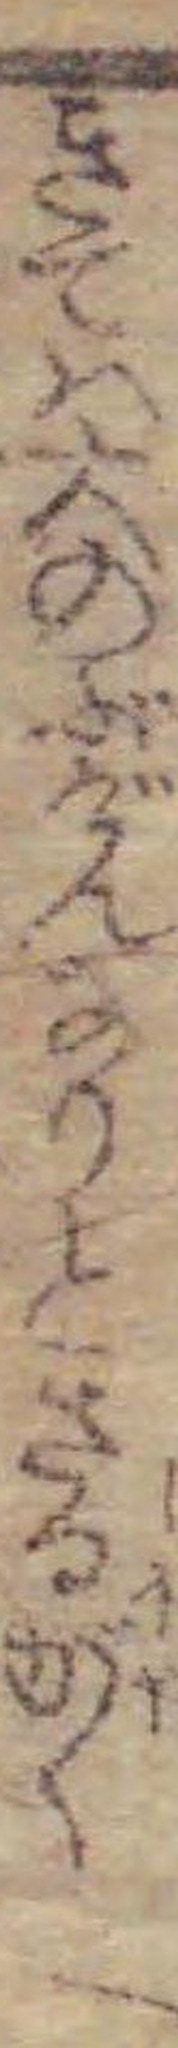きては大のぶげんなりとさるがく
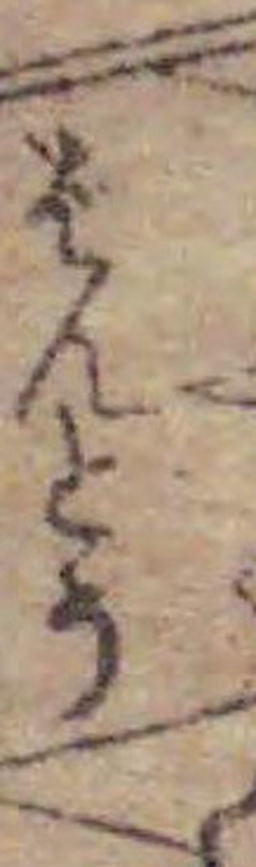ばんとう
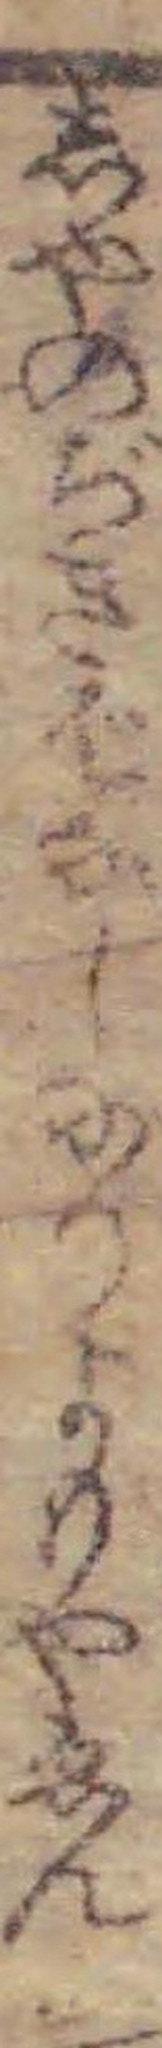しやのぢきばなしなりよもやゑん
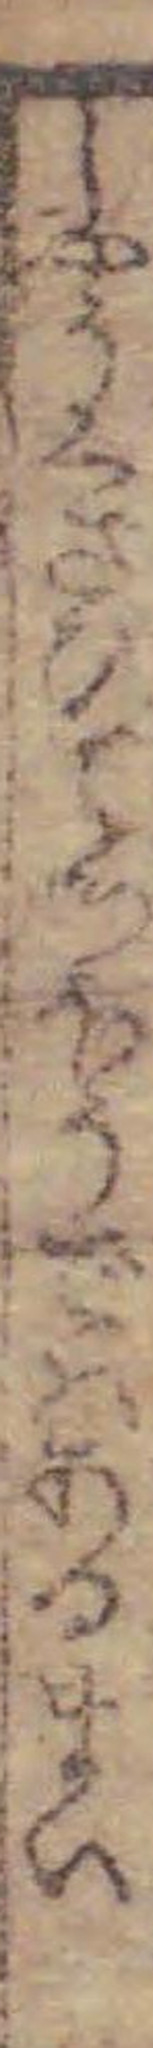しやうくさひてつほうではあるまい
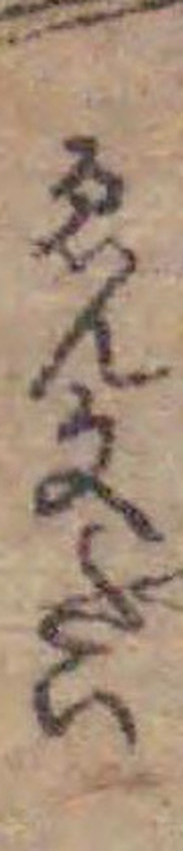ゑん文たい

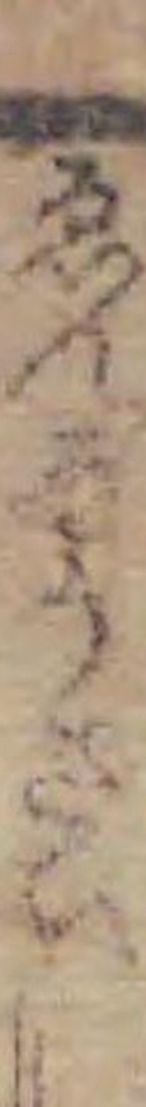ゑんしうさい
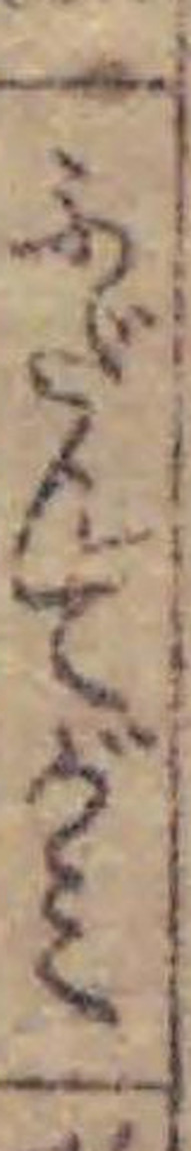ふだんてがみ
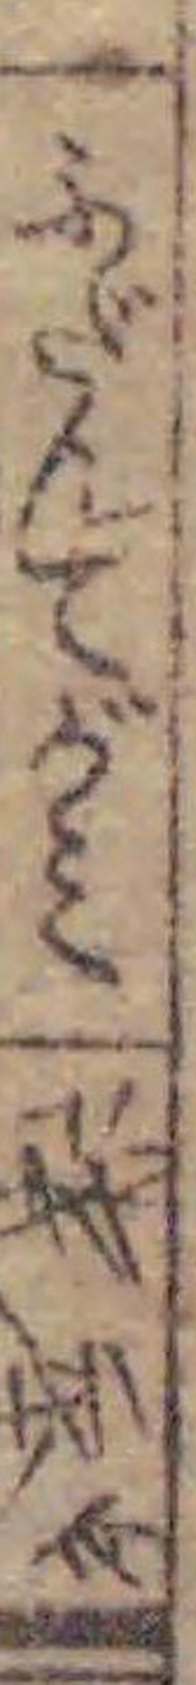ふだんてがみ
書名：此奴和日本 : 2巻
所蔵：国立国会図書館 National Diet Library, JAPAN
